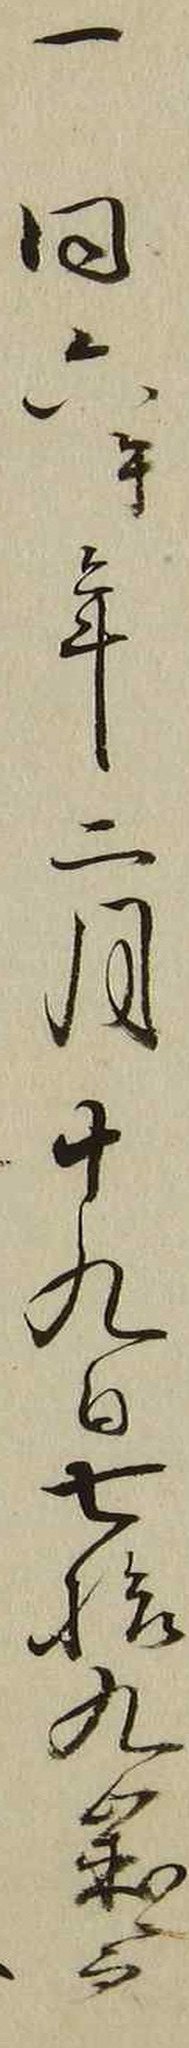一同六午年二月十九日七拾九歳に而
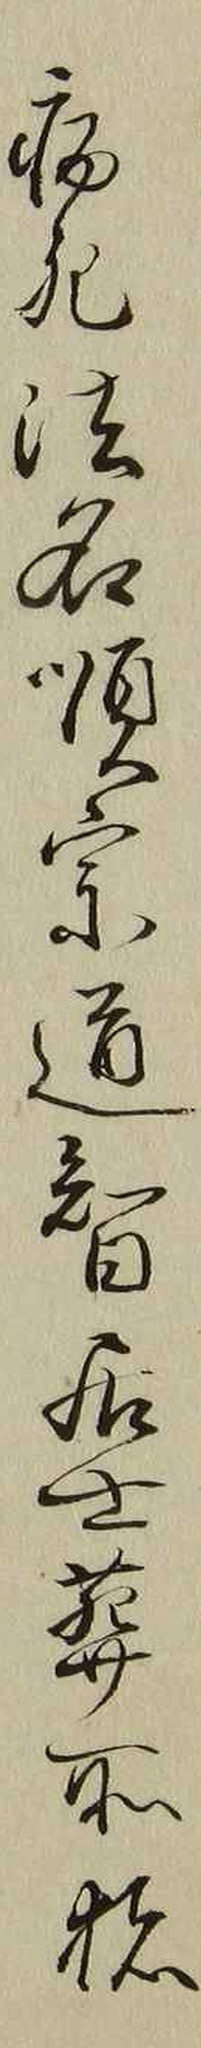病死法名順宗道智居士葬所猪
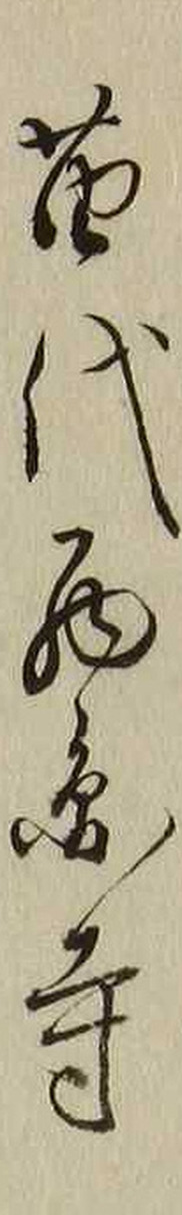苗代西円寺
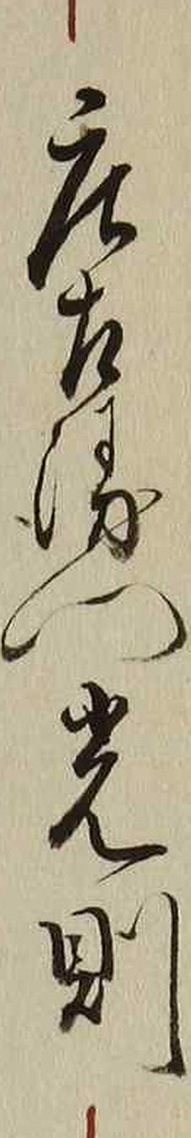庄左衛門光則
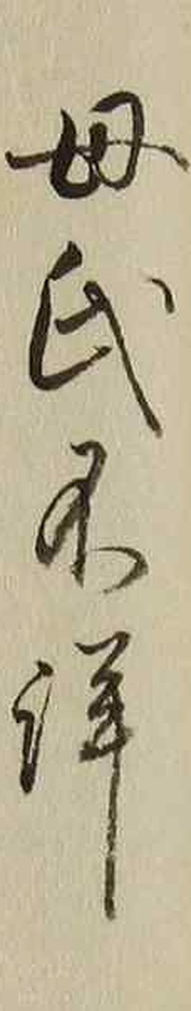母氏不詳
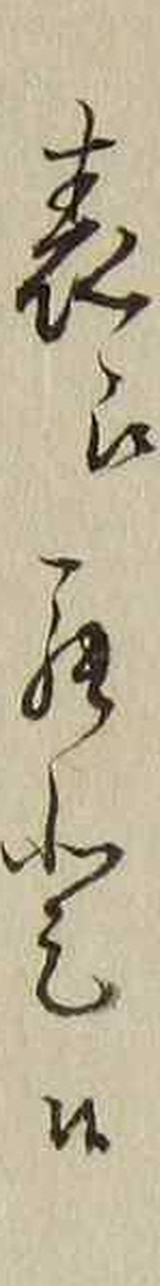表江罷登候
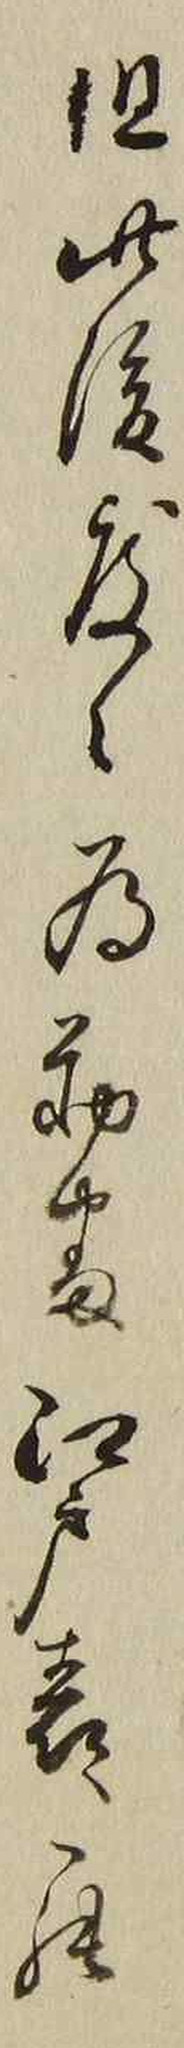但此後度々為勤番江戸表へ罷
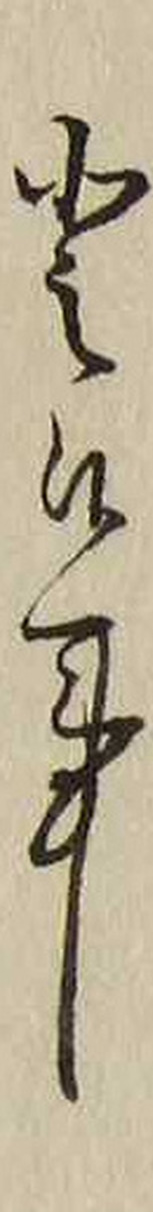登候事

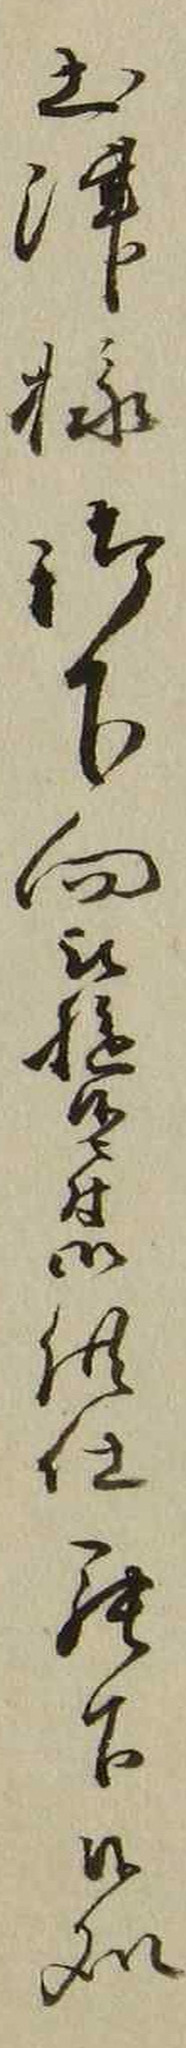土津様御下向被遊候に付御供仕罷下候処
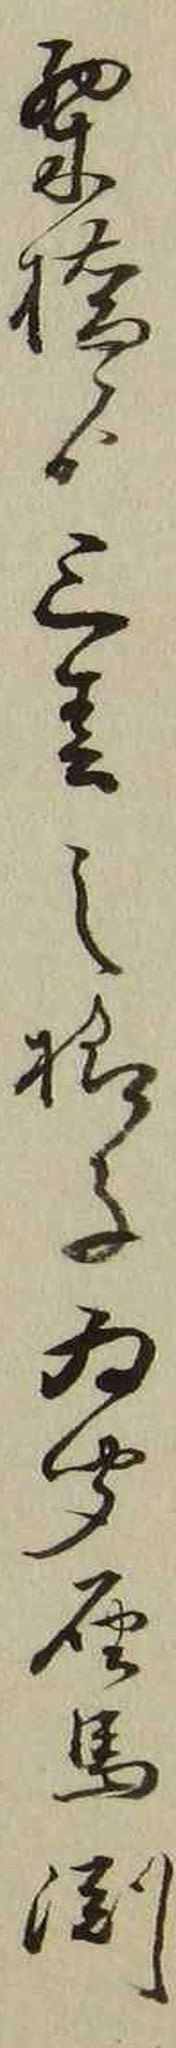栗橋ゟ三春の様子為聞届馬渕
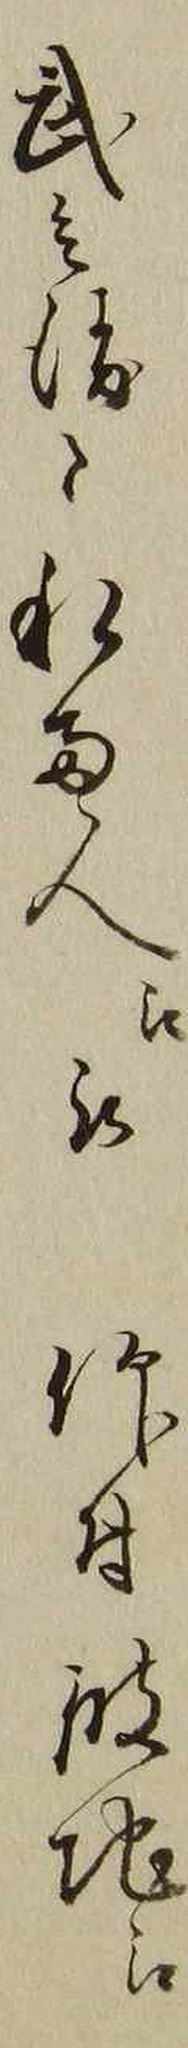武兵衛と私両人江被仰付彼地江
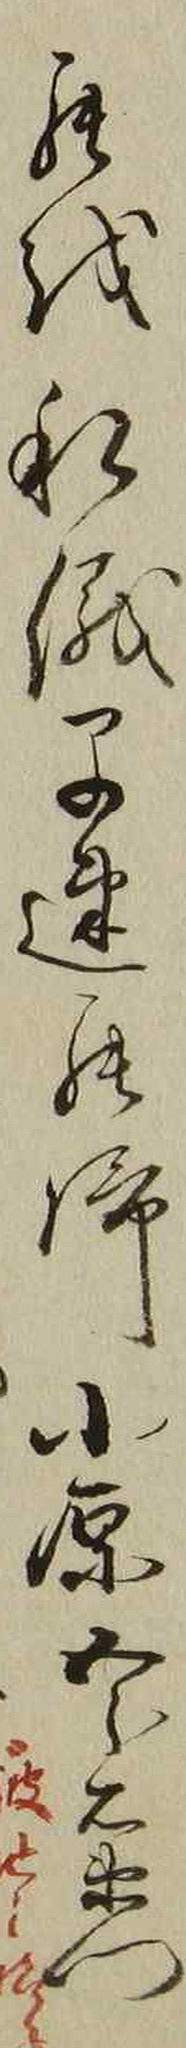罷越私儀早速罷帰小原五郎右衛門
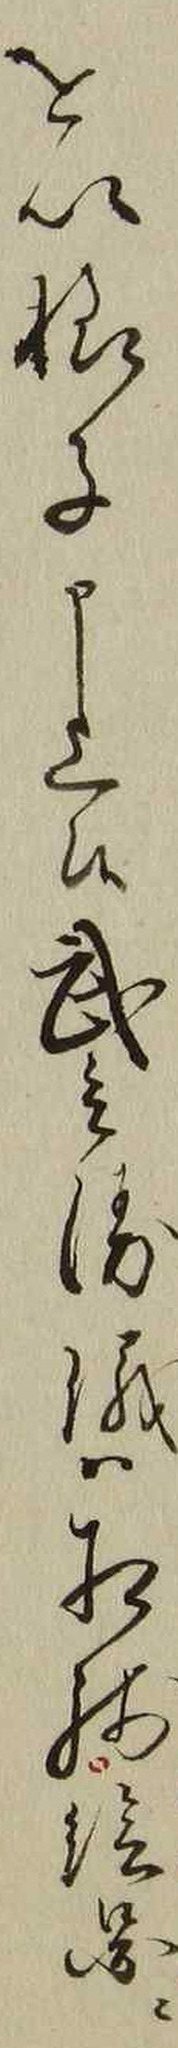を以様子申上候武兵衛儀は相残絵図
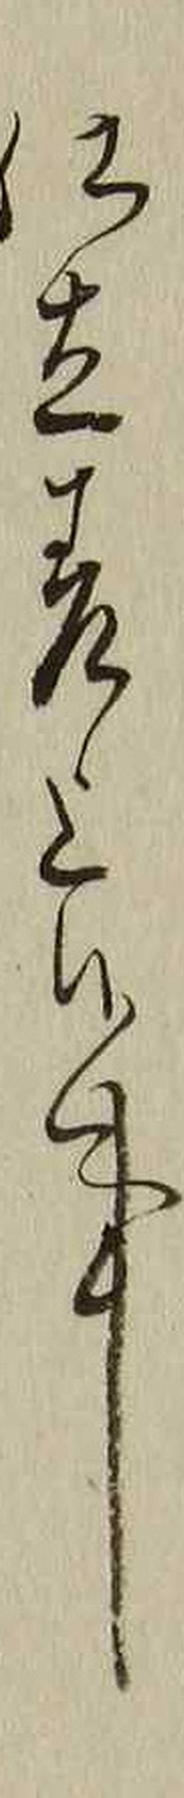仕立差上候事
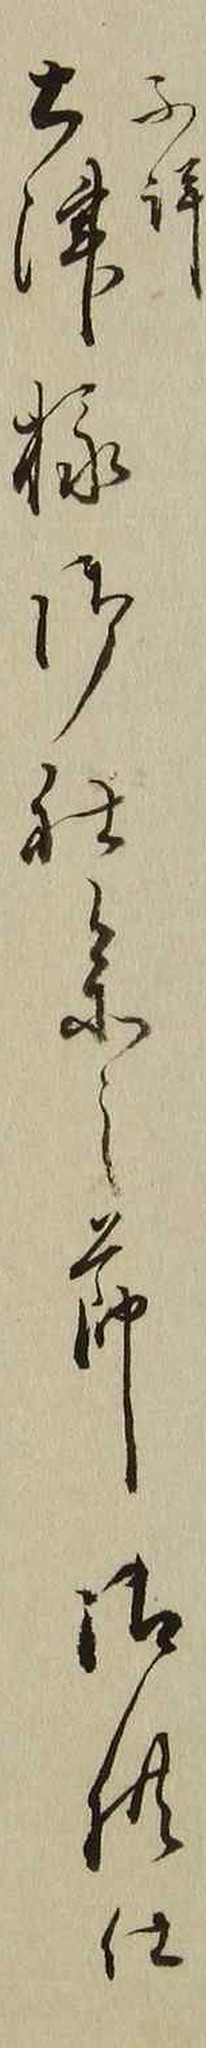土津様御社参の節御供仕
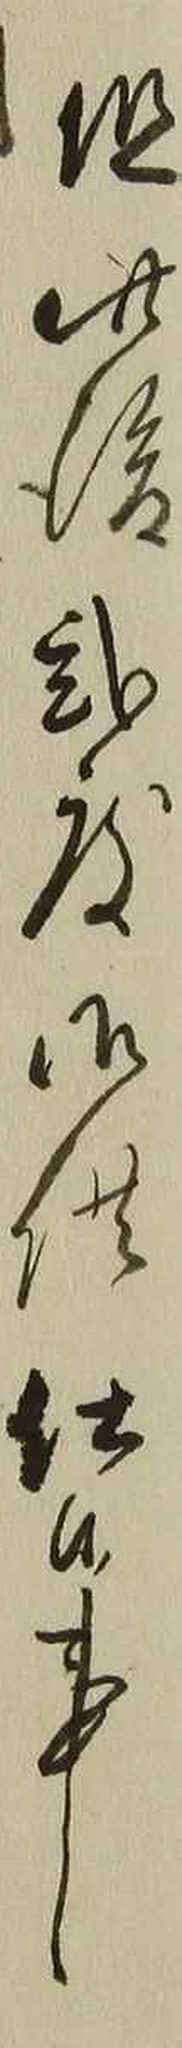但此後弐度御供仕候事
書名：諸士系譜　巻之1　い之部1
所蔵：会津若松市立会津図書館
